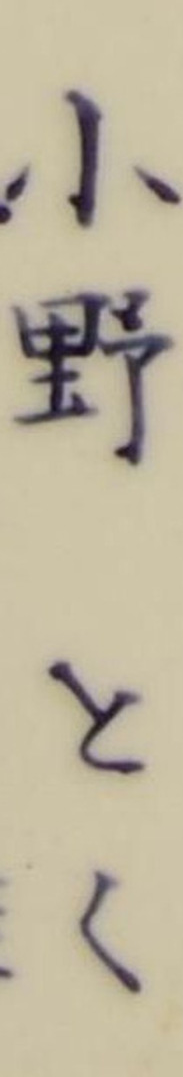小野をく
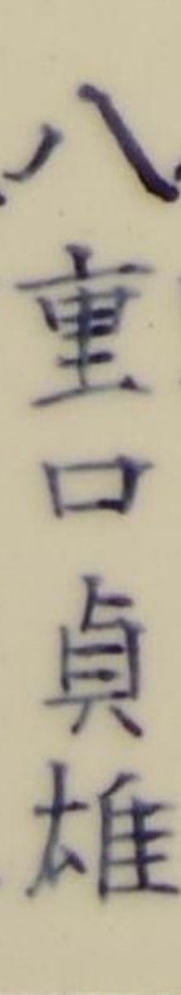八重口貞雄
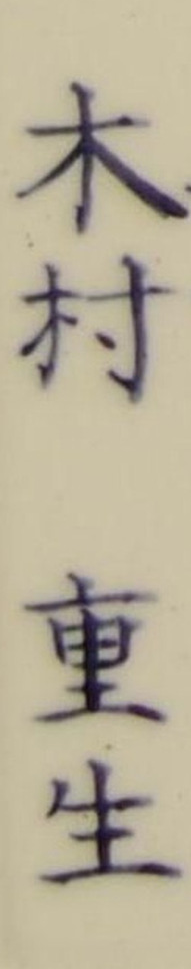木村重生

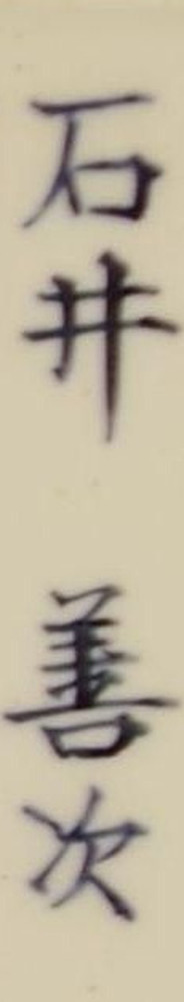石井善次
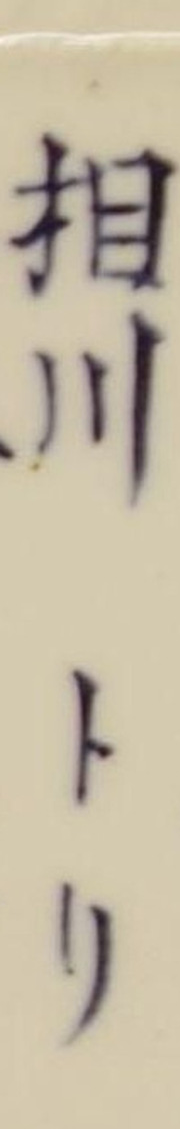相川トリ
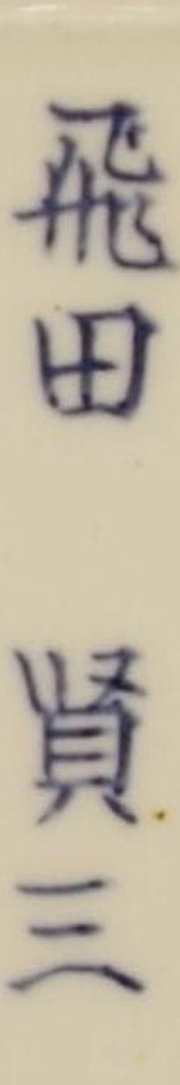飛田賢三
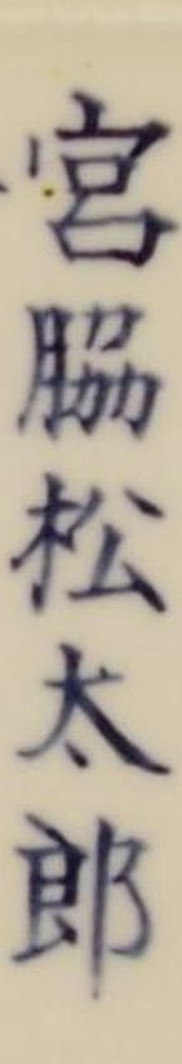宮脇松太郎
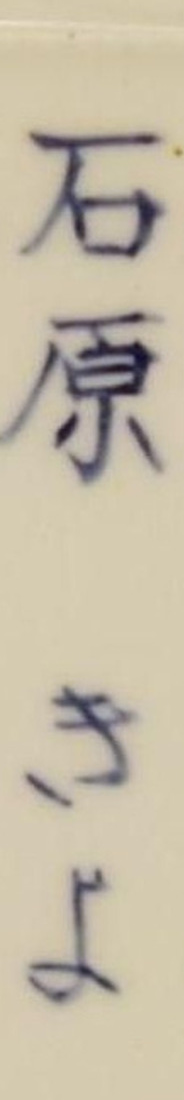石原きよ
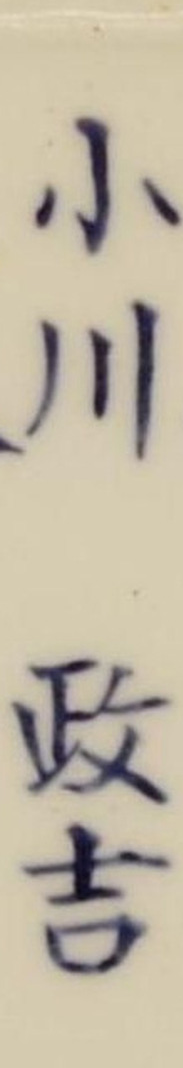小川政吉
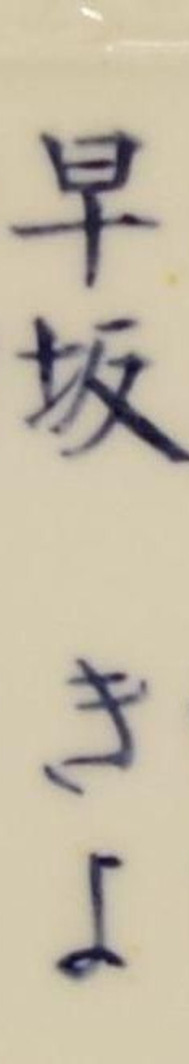早坂きよ
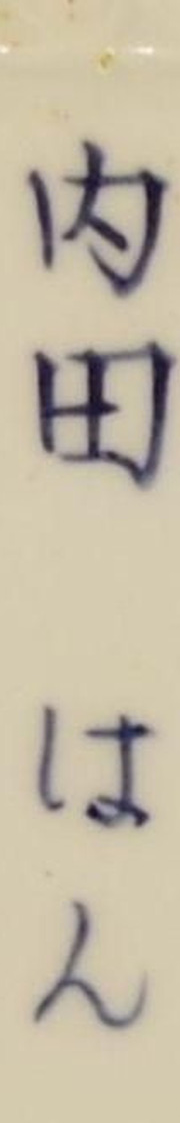内田はん
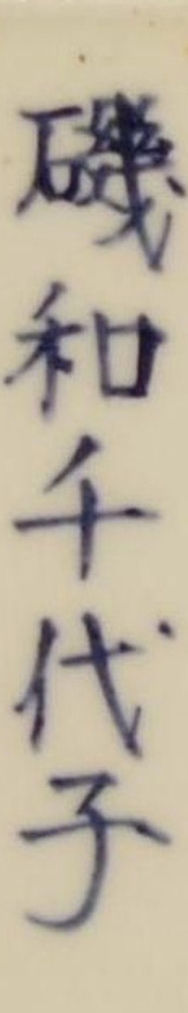磯和千代子
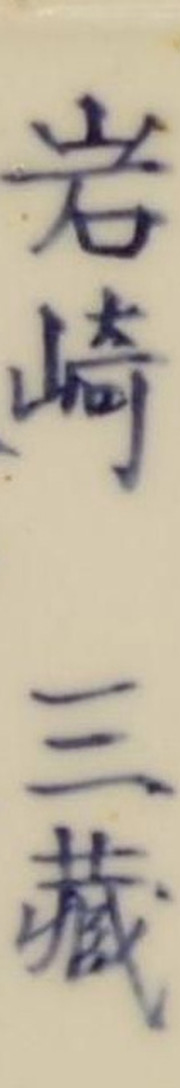岩崎三蔵
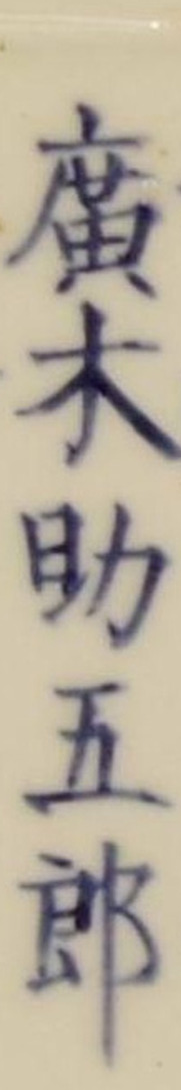広木助五郎
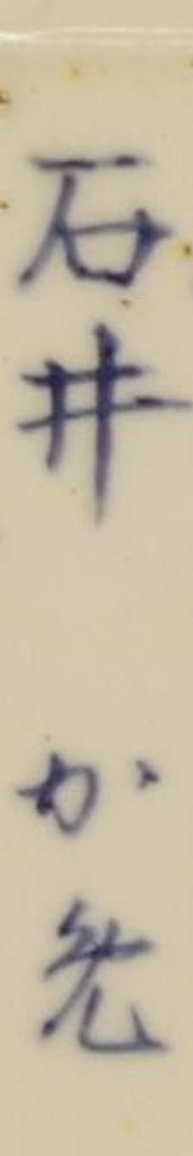石井かめ
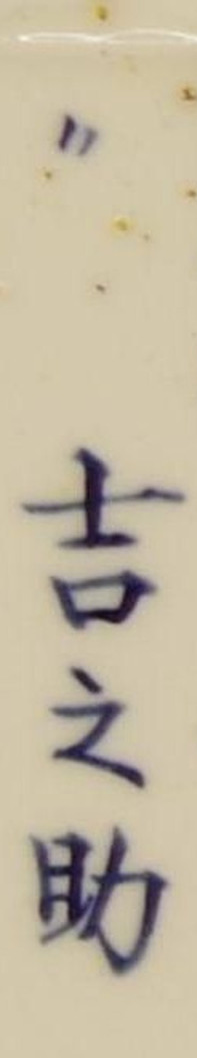吉之助
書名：E~L
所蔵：高野山金剛峯寺
